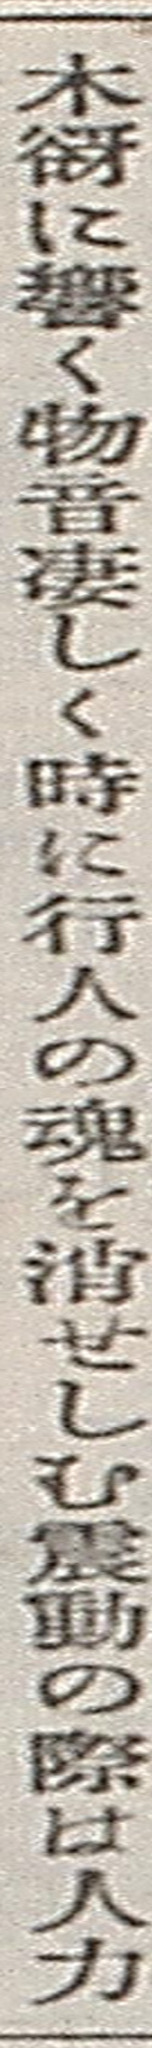木谺に響く物音凄しく時に行人の魂を消せしむ震動の際は人力
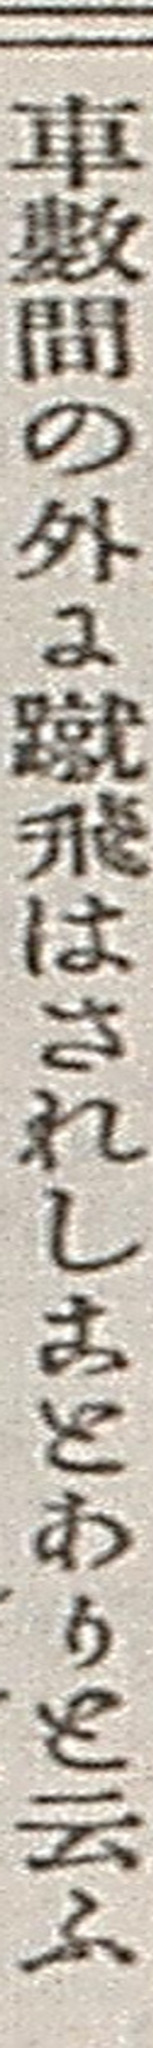車数間の外に蹴飛はされしことありと云ふ
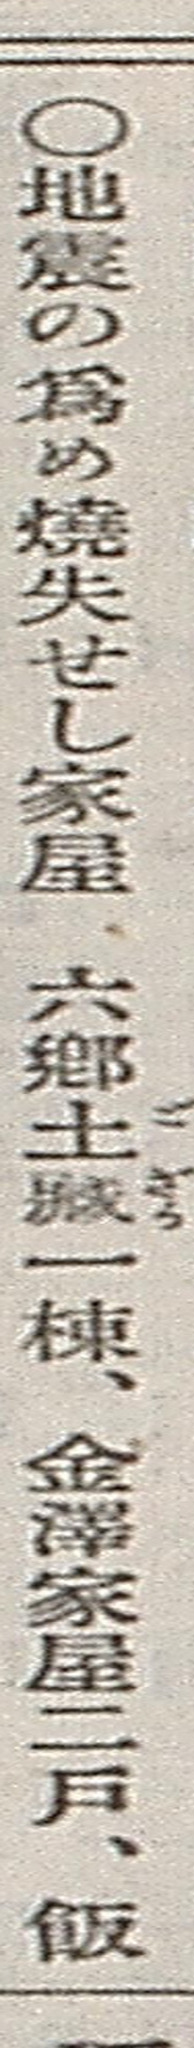〇地震の為め焼失せし家屋六郷土蔵一棟、金沢家屋二戸、飯
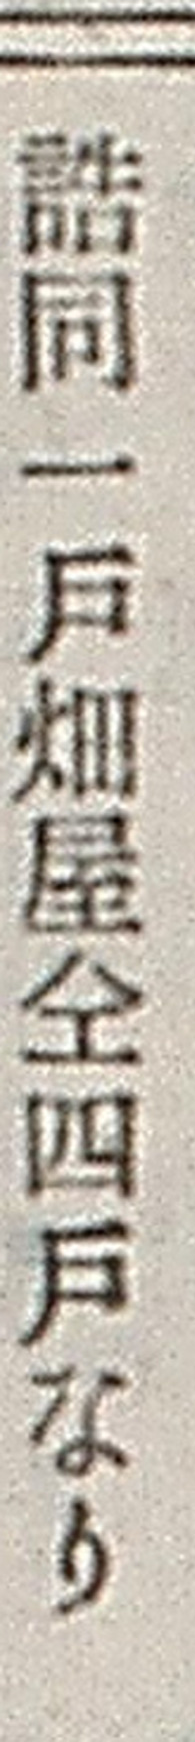詰同一戸畑屋仝四戸なり
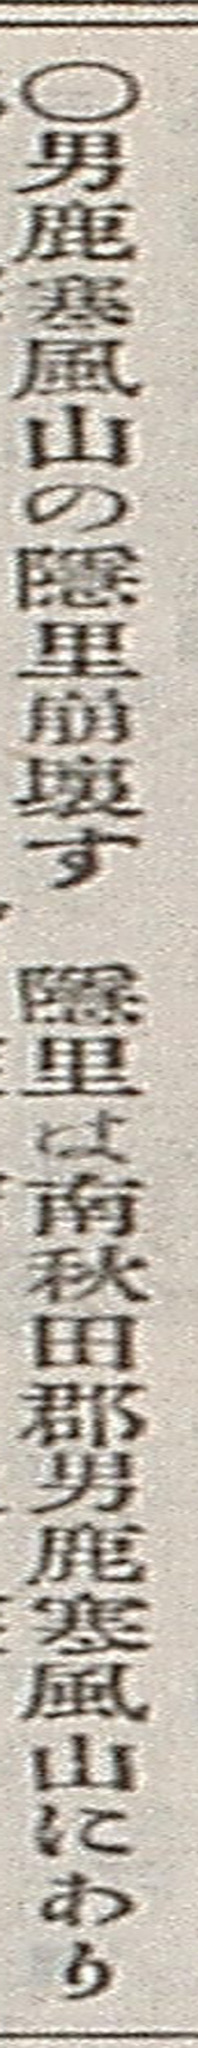〇男鹿寒風山の隠里崩壊す隠里は南秋田郡男鹿寒風山にあり
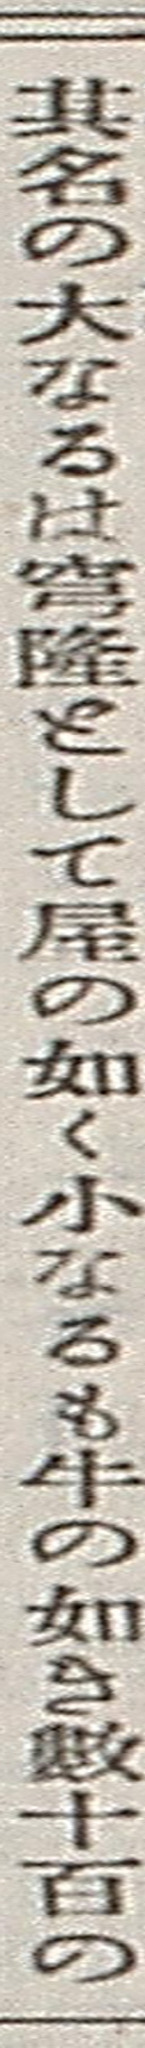其名の大なるは穹隆として屋の如く小なるも牛の如き数十百の
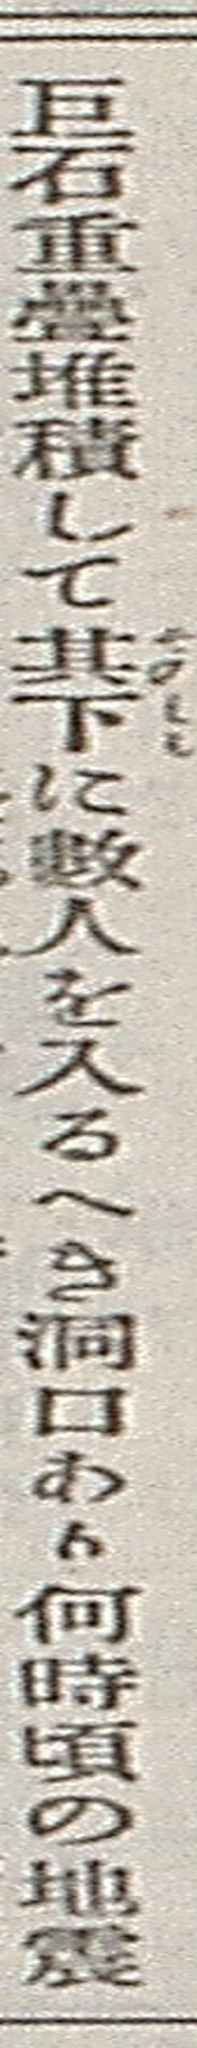巨石重畳堆積して其下に数人を入るへき洞口あり何時頃の地震
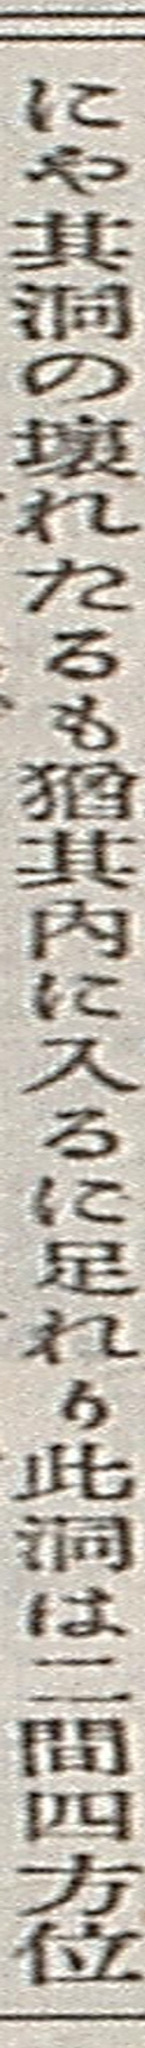にや其洞の壊れたるも猶其内に入るに足れり此洞は二間四方位
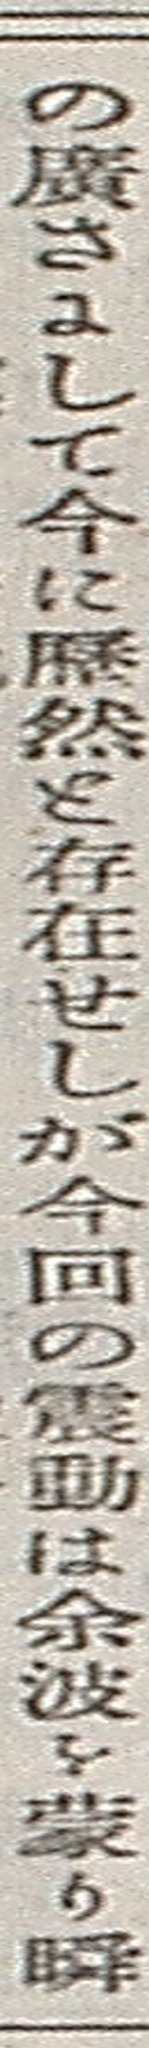の広さにして今に歴然と存在せしが今回の震動は余波を蒙り瞬
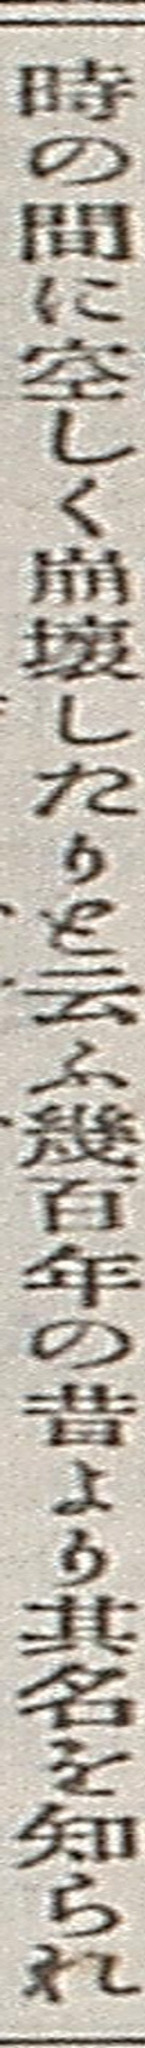時の間に空しく崩壊したりと云ふ幾百年の昔より其名を知られ
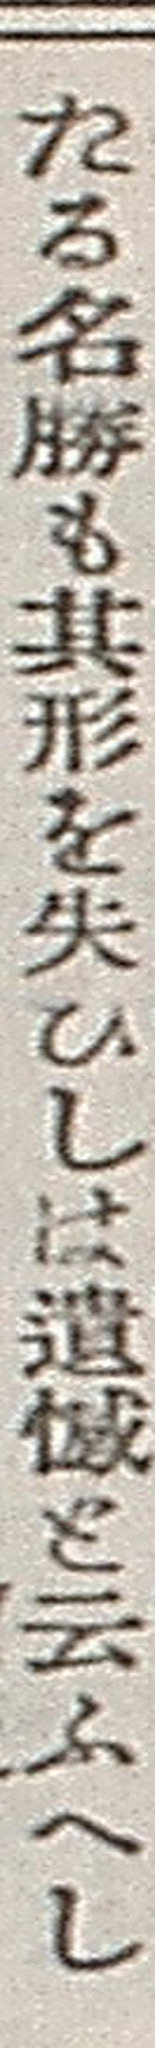たる名勝も其形を失ひしは遺憾と云ふへし
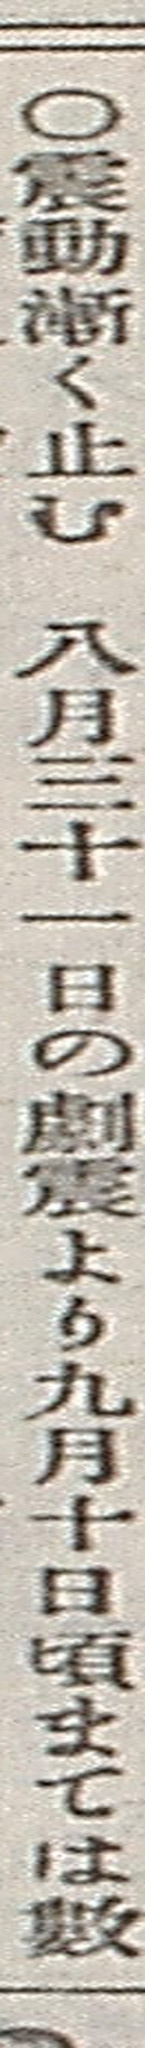〇震動漸く止む八月三十一日の劇震より九月十日頃まては数
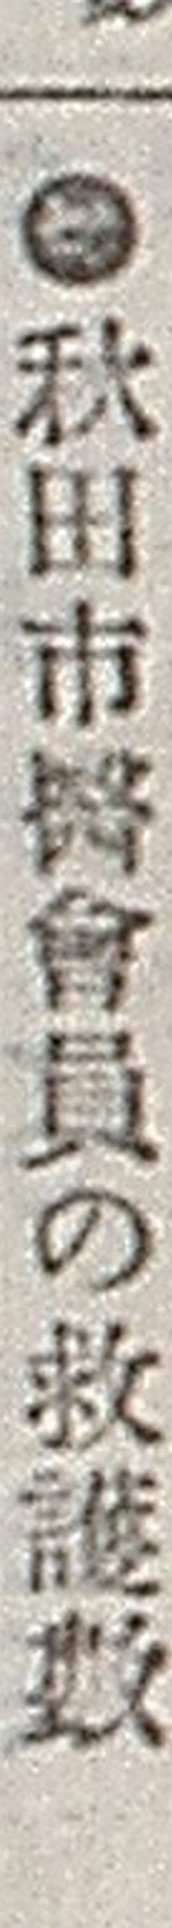●秋田市医会員の救護数
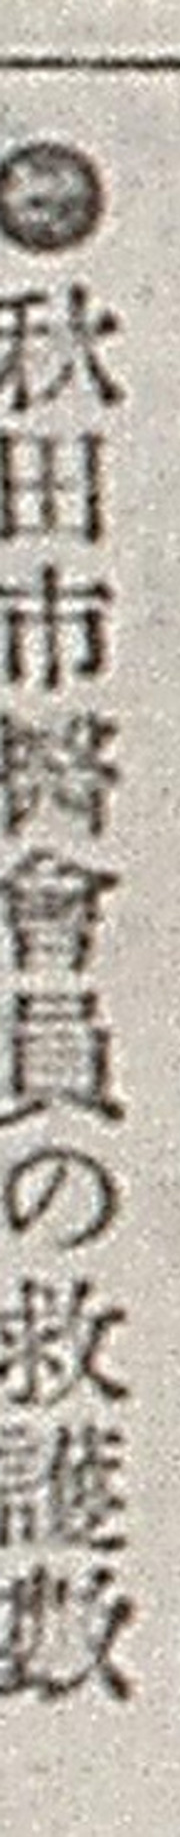●秋田市医会員の救護数
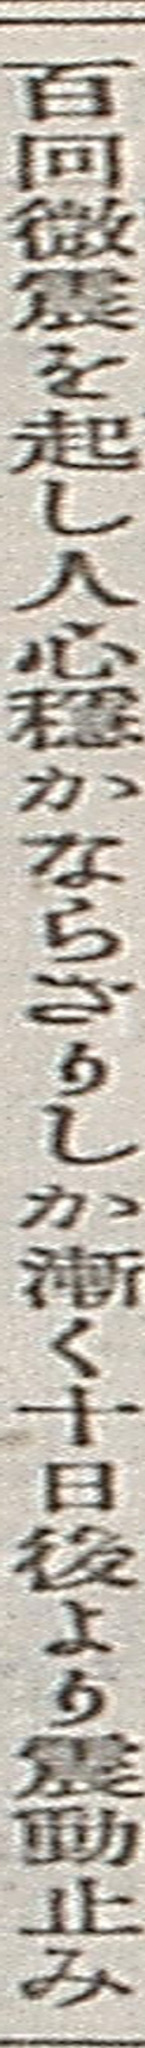百回微震を起し人心穏かならざりしか漸く十日後より震動止み
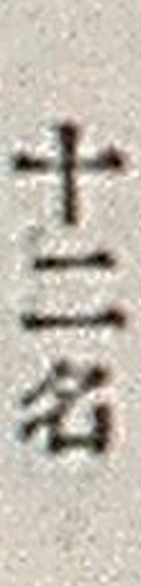婦二名
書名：風俗畫報臨時増刊第百二十四號　洪水地震被害録（上）
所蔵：東京大学地震研究所図書室 Earthquake Research Institute Library, The University of Tokyo, JAPAN
